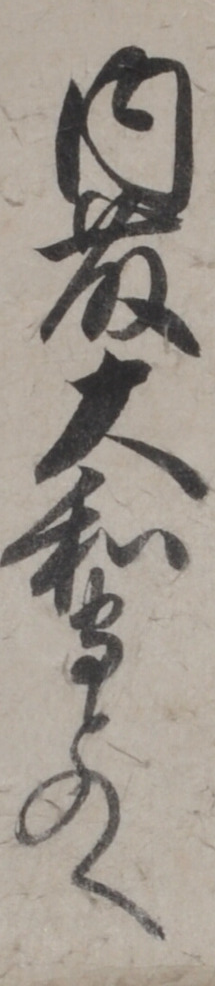内藤大和守とのへ

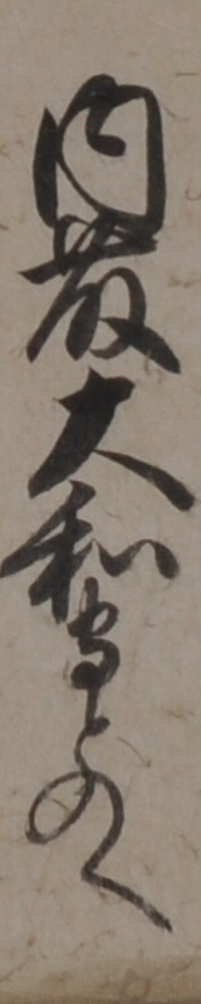内藤大和守とのへ
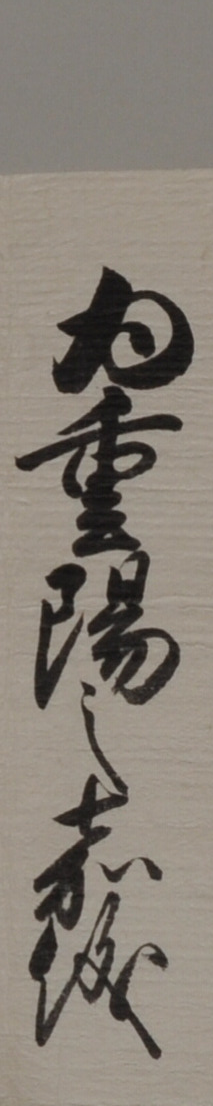為重陽之嘉儀
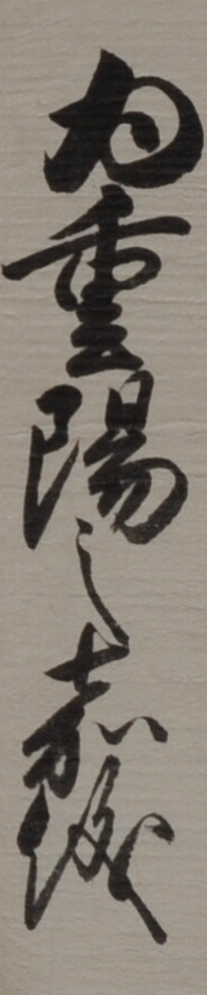為重陽之嘉儀
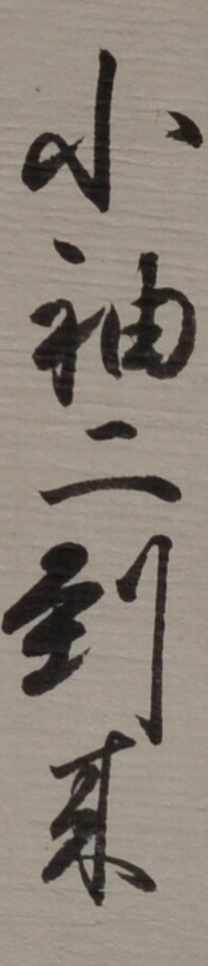小袖二到来
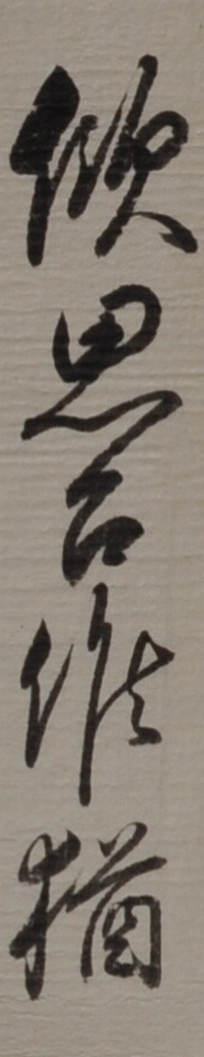欣思召候猶
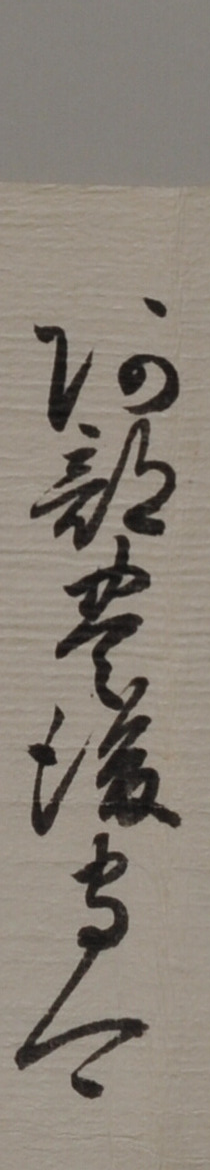阿部豊後守可
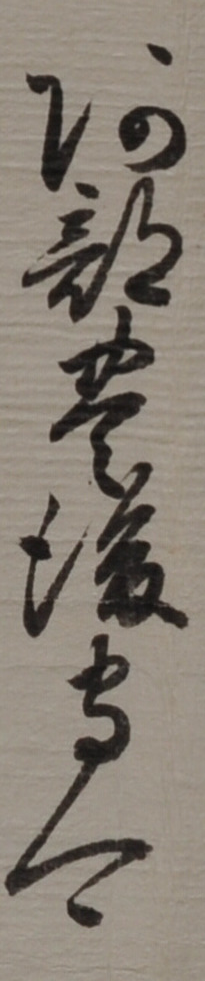阿部豊後守可
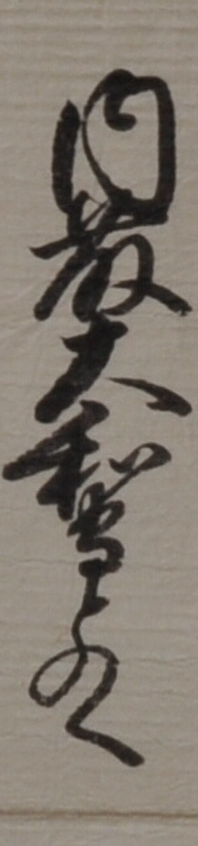内藤大和守とのへ
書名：御内書
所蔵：伊那市立高遠町図書館・合同会社AMANE
